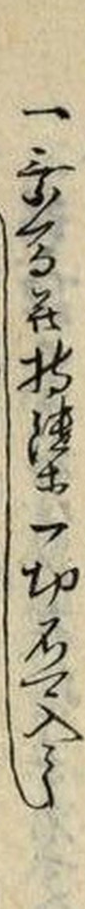一乗馬并持鑓等一切不可入之
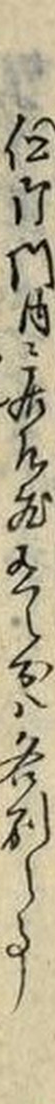但御門内ニ居屋敷有之分ハ格別之事
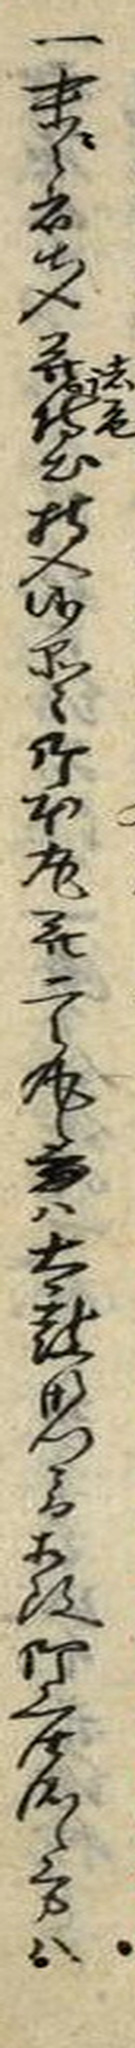一末々之者出入并諸色持出持入候品々御本丸并二之丸之義ハ太鼓御門ニ而相改御座所之方ハ

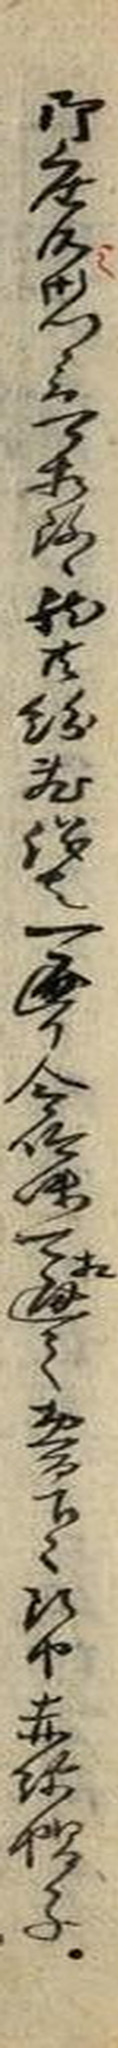御座所之御門ニ而可相改候然共紛敷儀は一通り令吟味可相通之惣而下々頭巾赤綿帽子
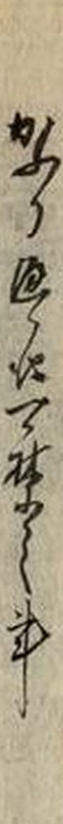かふり通候儀可禁之事
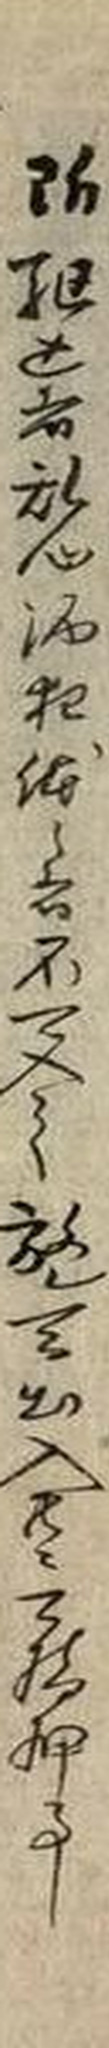附駆込者乱心酒狂体之者不可入之放レ馬出入共ニ可指押事
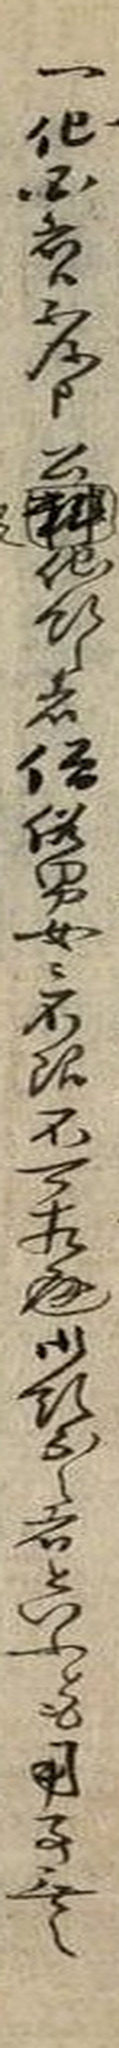一他国者ハ不及申公領他領之者僧俗男女ニ不限不可相通御領分之者といふとも用事無之
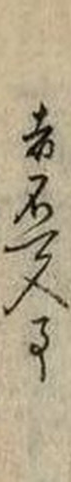者不可入事
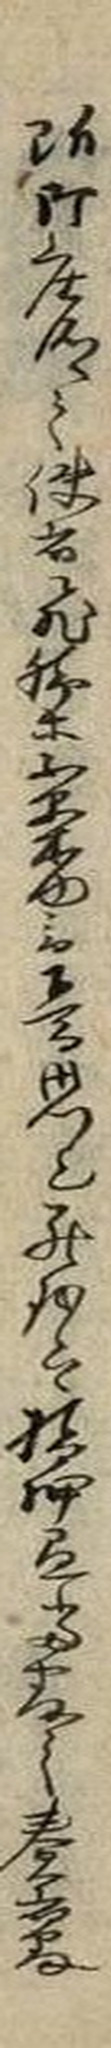附御座所之使者飛脚等不案内ニ而下馬御門迄罷越候ハヽ指押置当番之奏者番
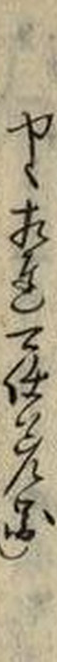中へ相達可任差図
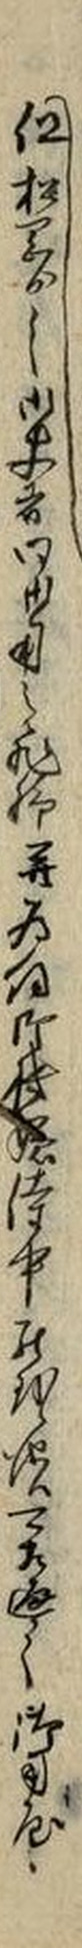但松岡ゟ之御使者同御用之飛脚并為伺御機嫌侍中罷越候儀ハ可相通之御用屋
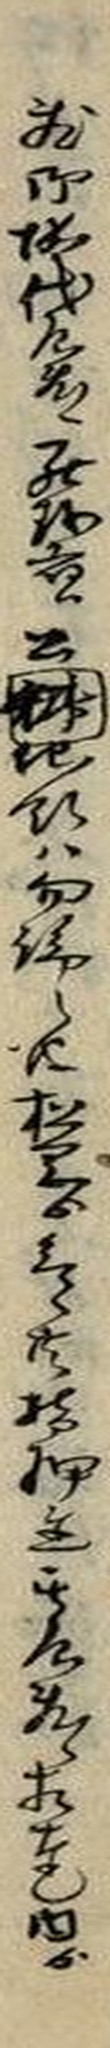敷御城代屋敷へ罷越者ハ公領他領ハ勿論之儀松岡ゟ参候共指押置其屋敷へ相達内ゟ
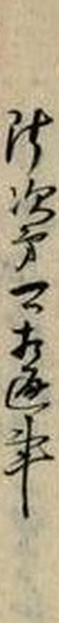断次第可相通事
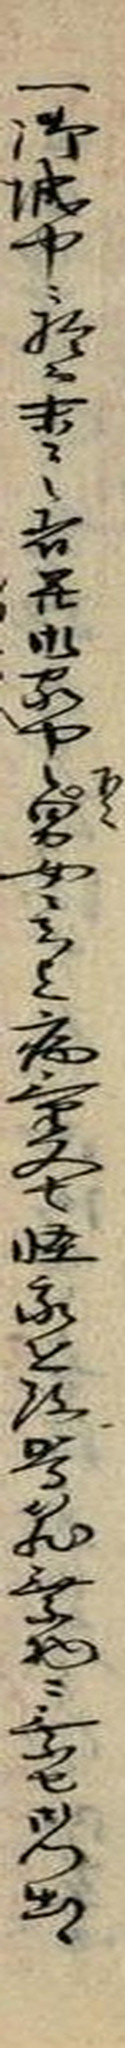一御城中ニ於而末々之者并御家中之下々男女ニ至迄病気又は怪我を致駕籠乗物ニ乗せ御門出候
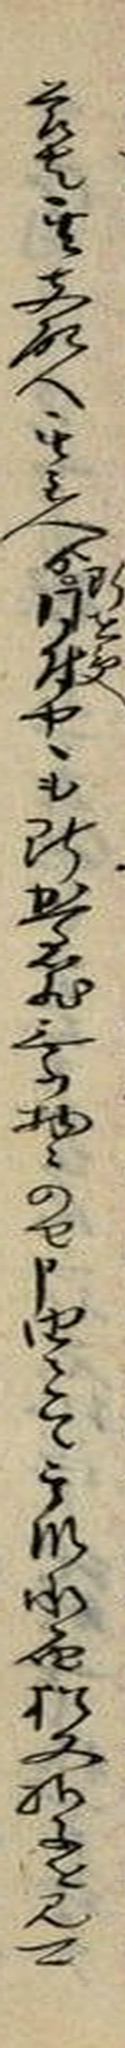節は其支配へ其主人ゟ断を受御目付中へも断駕籠乗物ニのせ申由ニ候ハヽ其段承届猶又様子を見可
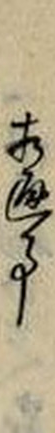相通事
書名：御門御櫓之部
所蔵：福井県文書館 Fukui Prefectural Archives
